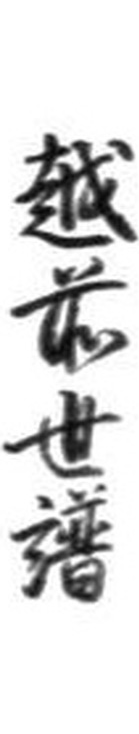越前世譜
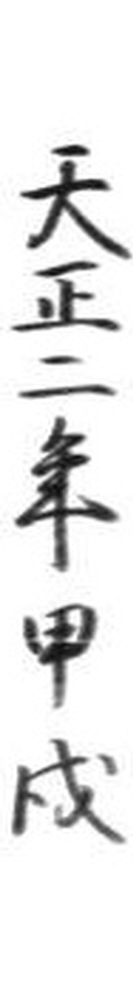天正二年申戌
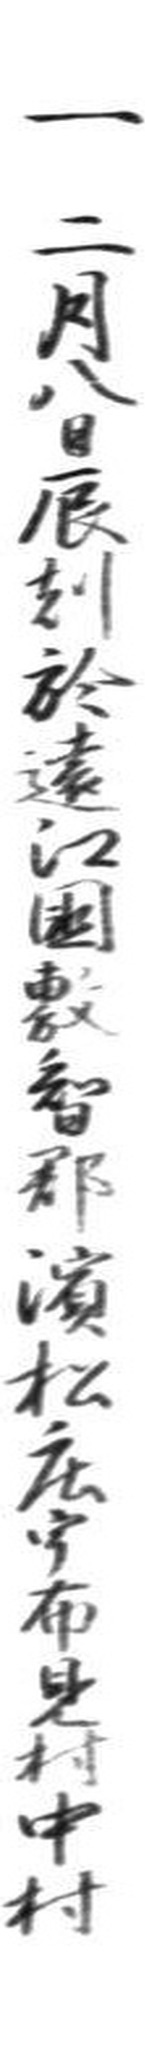一二月八日辰刻於遠江国敷智郡浜松庄宇布見村中村

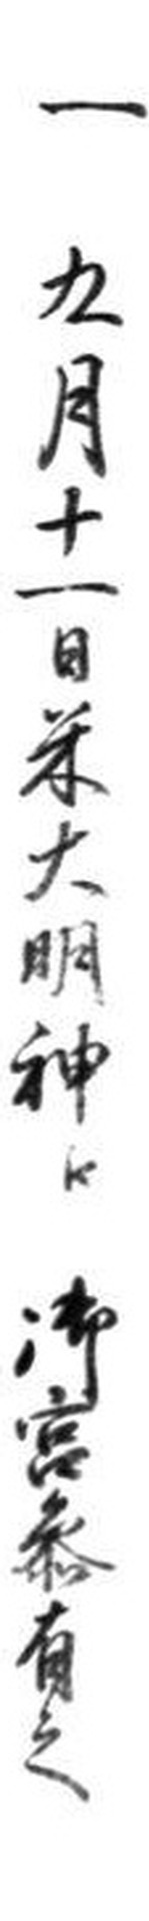一九月十一日米大明神江御宮参有之
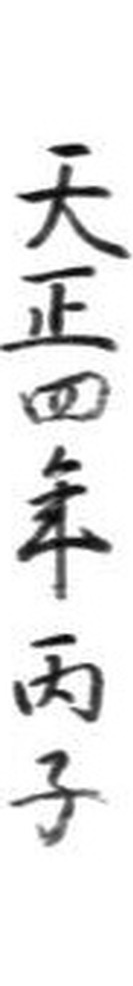天正四年丙子
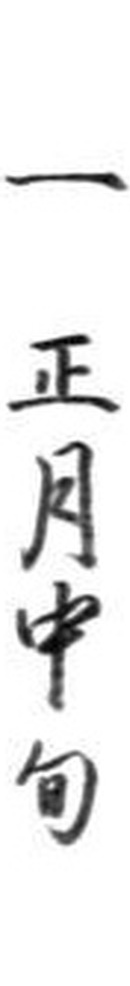一正月中旬
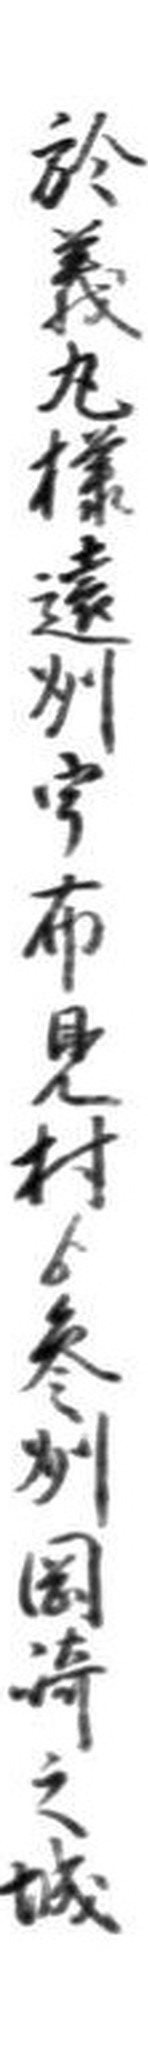於義丸様遠州宇布見村ゟ参州岡崎之城
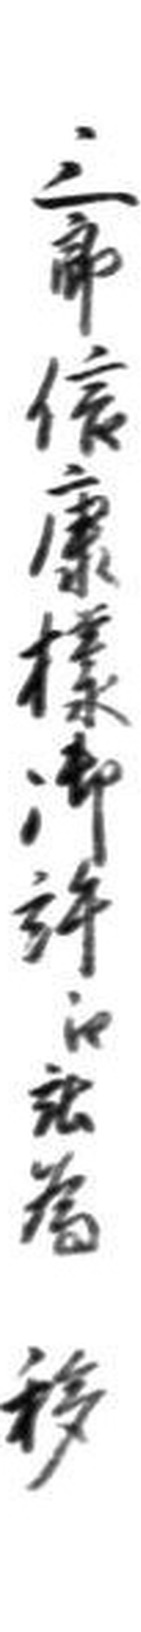三郎信康様御許江被為移
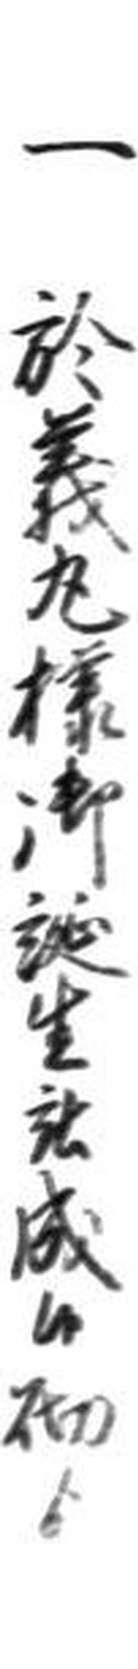一於義丸様御誕生被成候砌ゟ
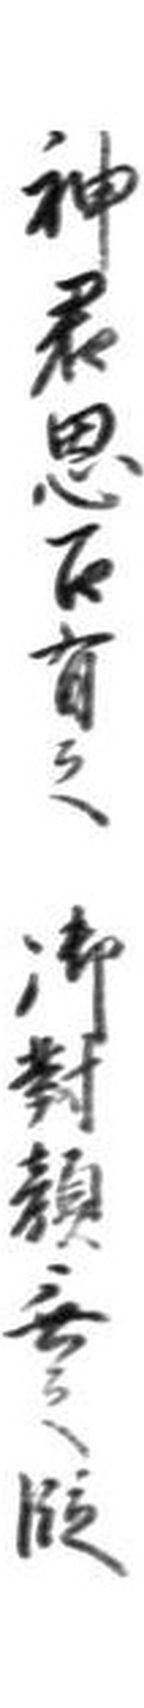神君思召有之御対顔無之段
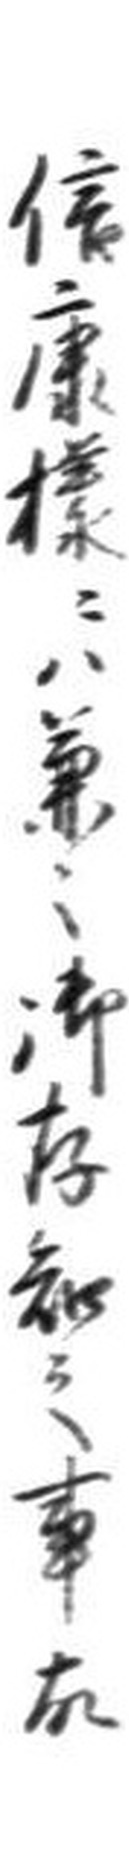信康様ニハ兼々御存知之事故
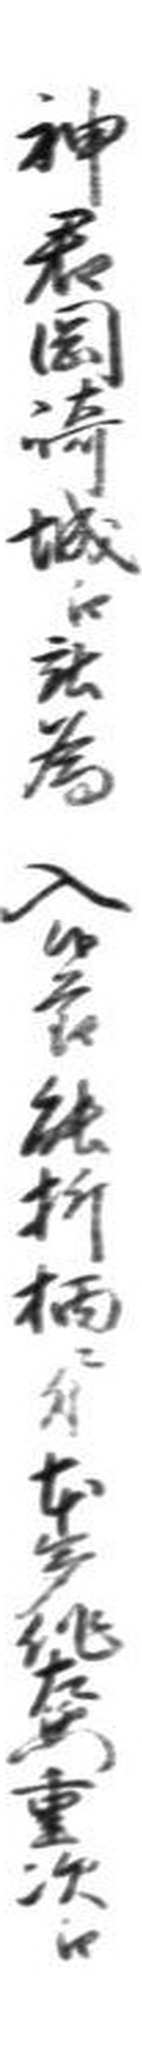神君岡崎江被為入候節能折柄ニ付本多作左衛門重次江
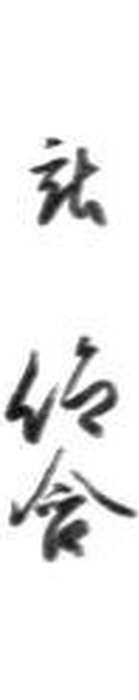被仰含

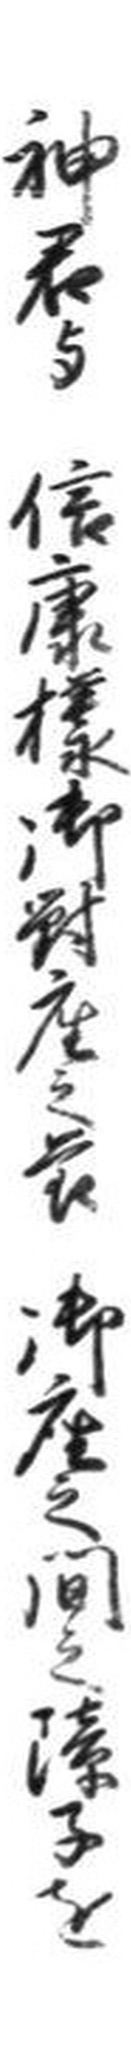神君与信康様御対座之節御座之間之障子を
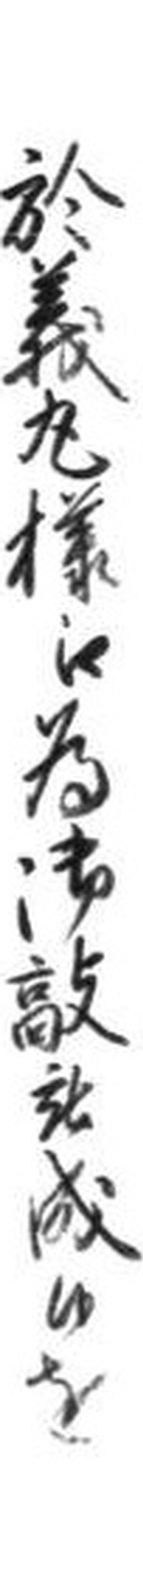於義丸様江為御敲被成候を
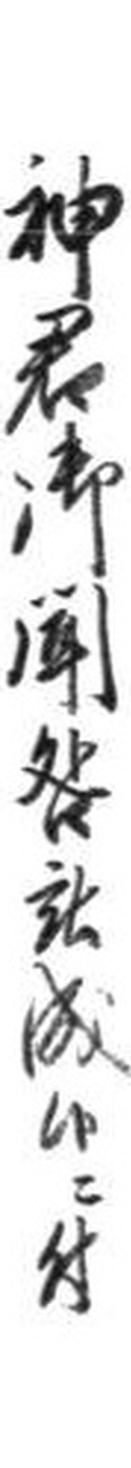神君御聞咎被成候ニ付
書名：家譜 一 秀康公 従天正二年到慶長十二年
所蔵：福井県文書館 Fukui Prefectural Archives
